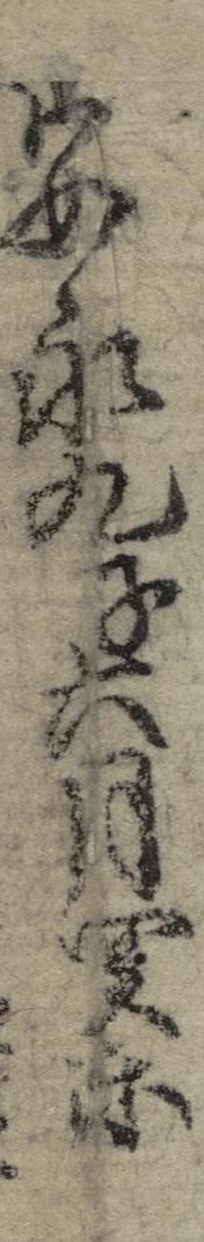安永九子六月関東
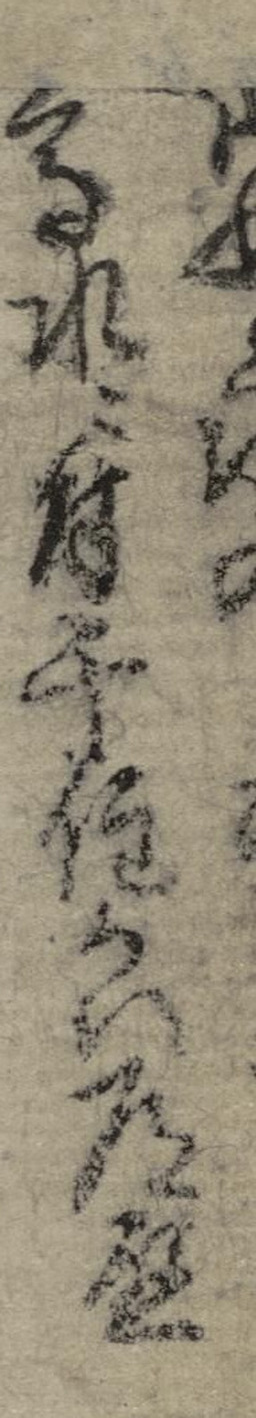高水ニ付千住かい道通
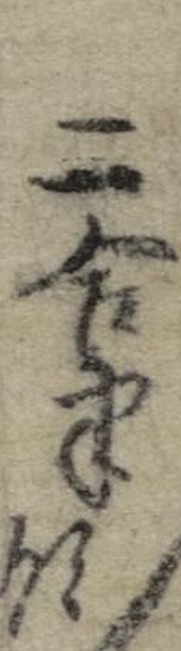二合半領
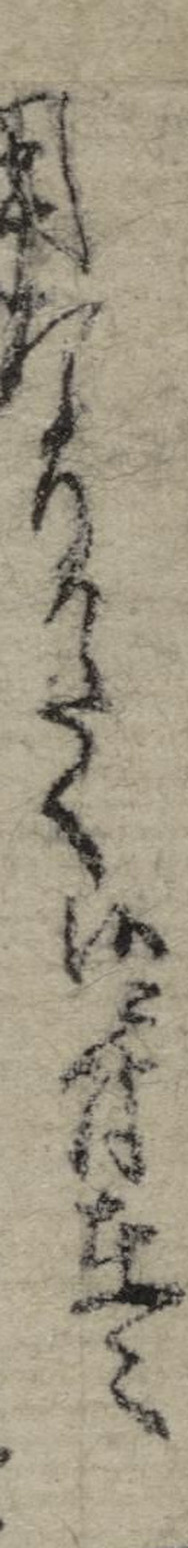用なりかたく候ニ付在々
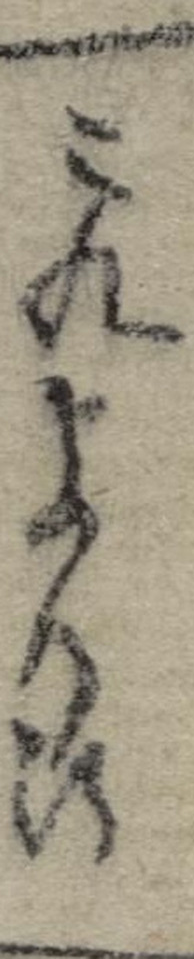これより行
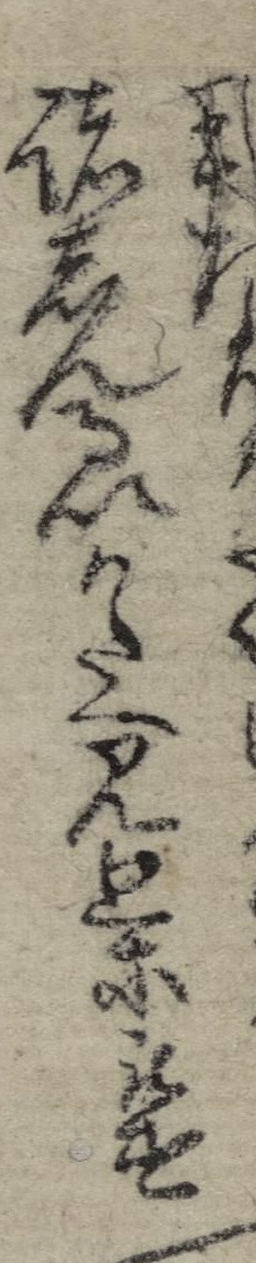諸しんるいかた見廻等被遣
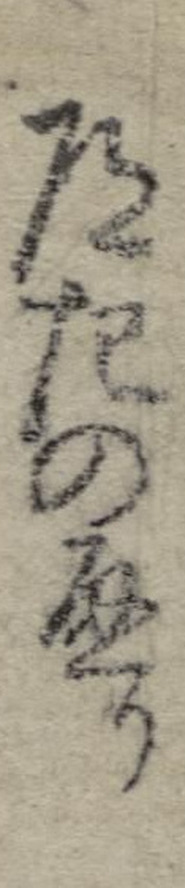道左の通り
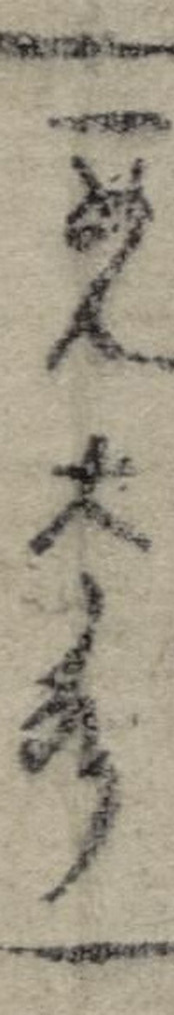一めん大水
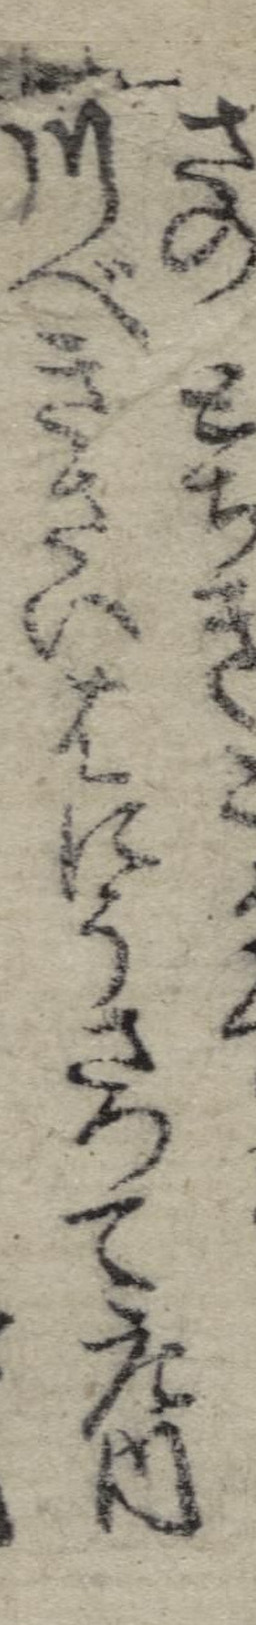川べきさいはにうさつて庄内
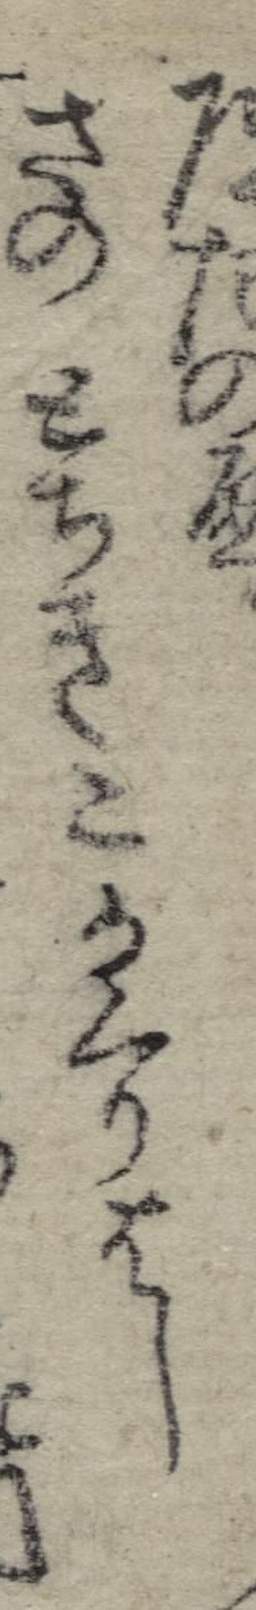さのとちきこうくりはし
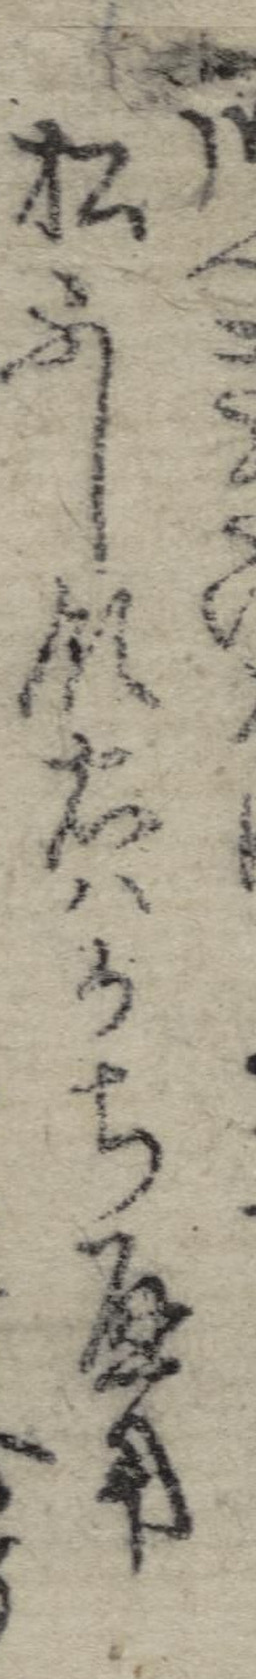松ふし領右はうち通用
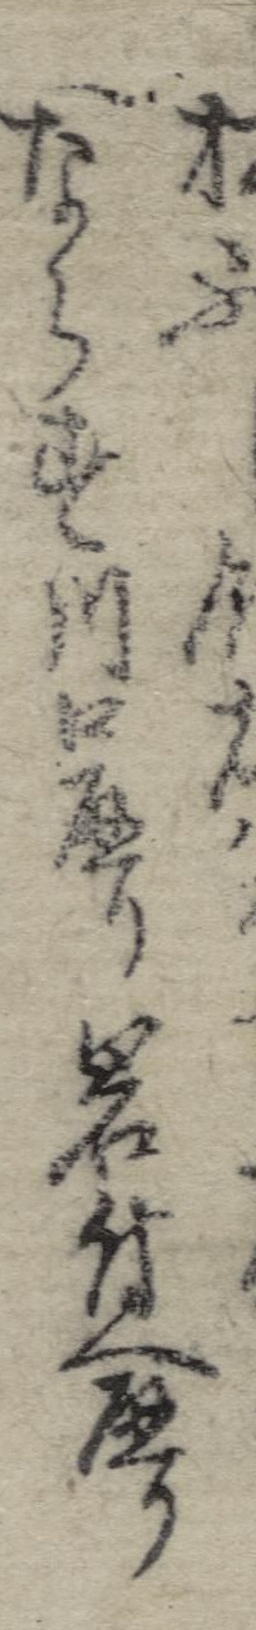ならす川口通り岩付へ通り
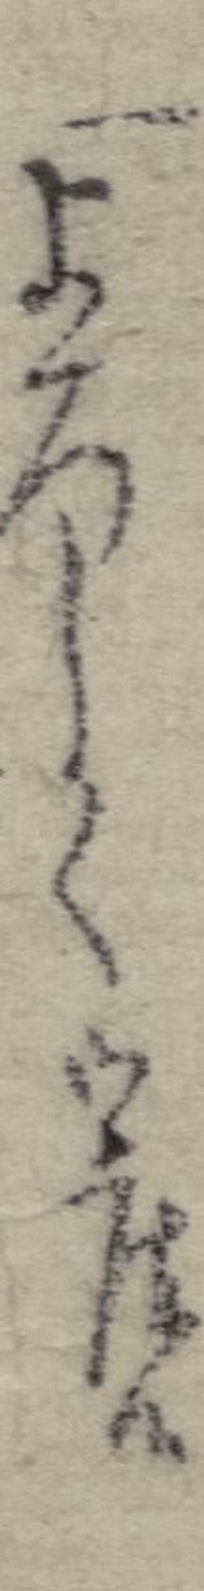よろしく御座候
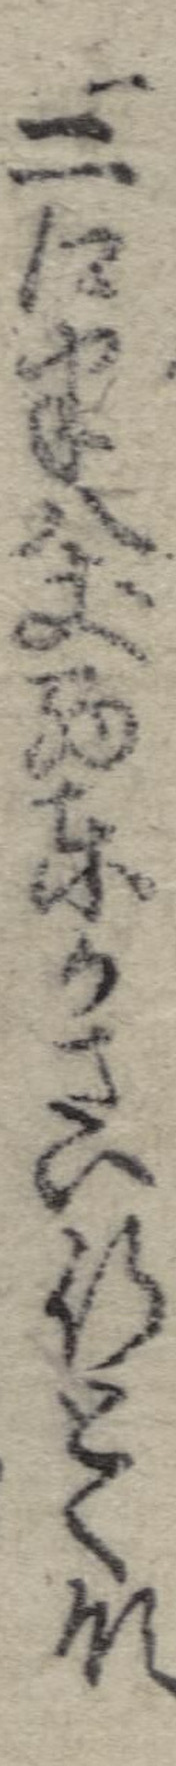二郷半八丈西東かさい行とく領
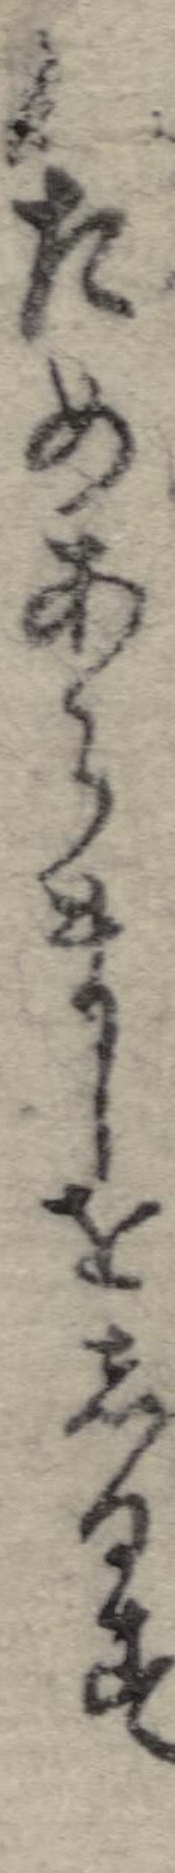ためあらましをしるす
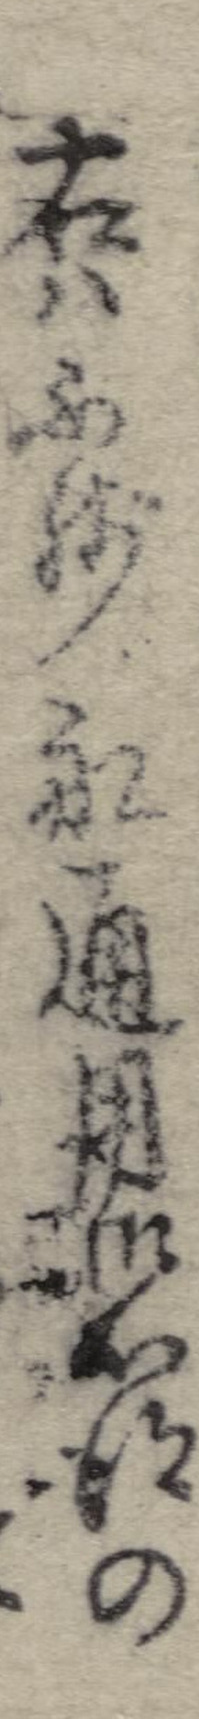右は不残船通用御心得の
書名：[安永九年六月の武蔵国出水に関する瓦版]
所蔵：東京大学地震研究所図書室 Earthquake Research Institute Library, The University of Tokyo, JAPAN
